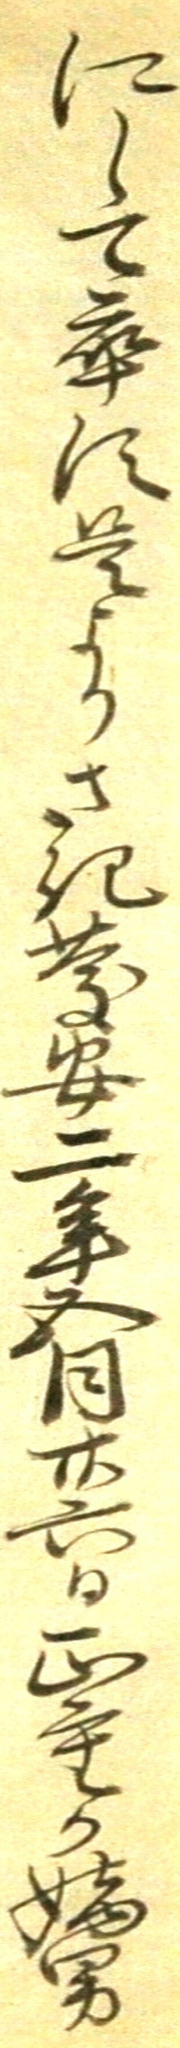にして卒す是よりさき慶安二年五月廿六日正重か嫡男
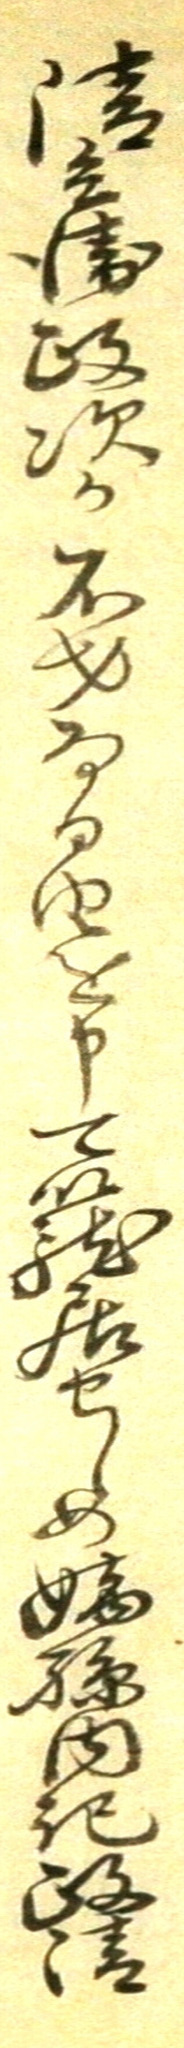清兵衛政次か不才なる由を申て籠居せしめ嫡孫内記政清
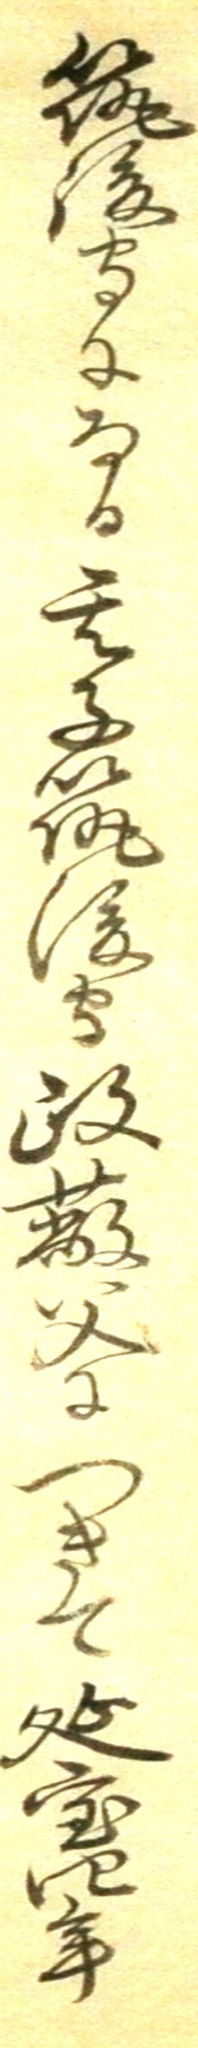筑後守になる其子筑後守政蔽父につきて延宝四年
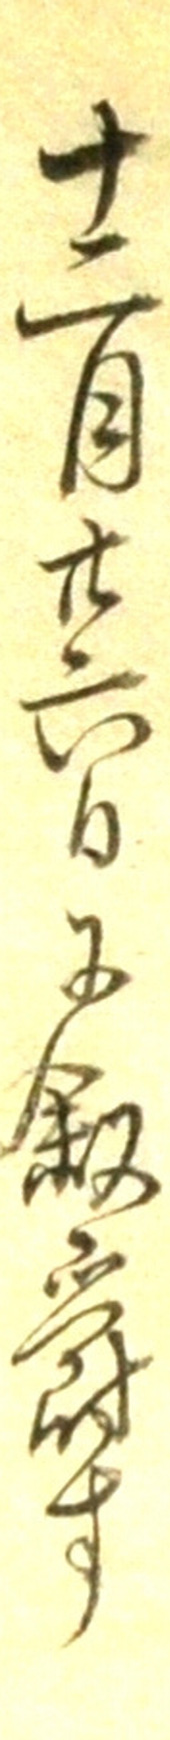十二月廿六日に叙爵す
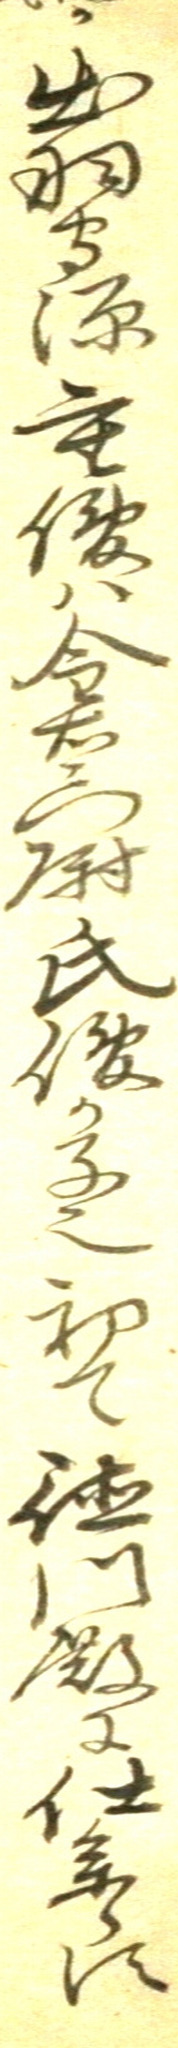出羽守源重俊は金右ヱ門尉氏俊か子也初て徳川殿に仕参らす
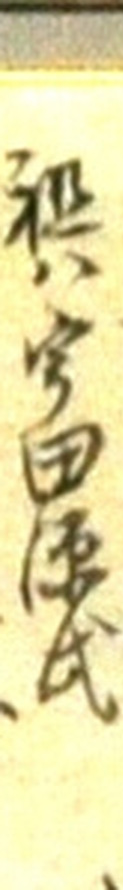祖は宇田源氏
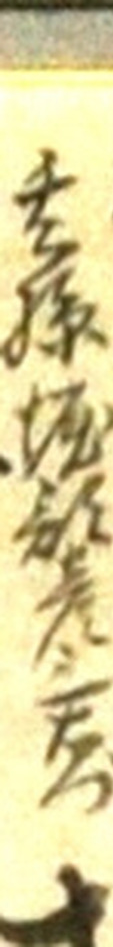其孫堀部彦三右衛門
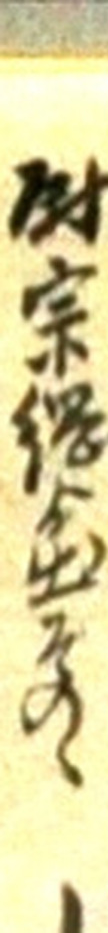尉宗綱より出そのゝ
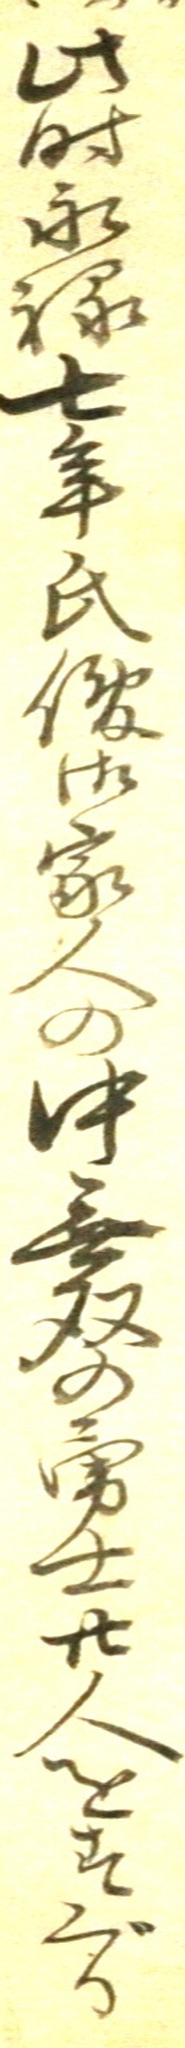此時永禄七年氏俊御家人の中無双の勇士廿人をすぐり
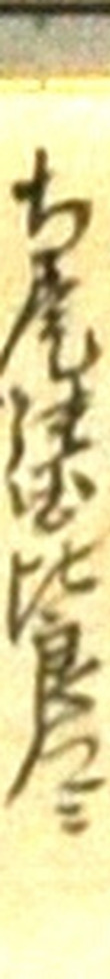ち尾張国比良郷に
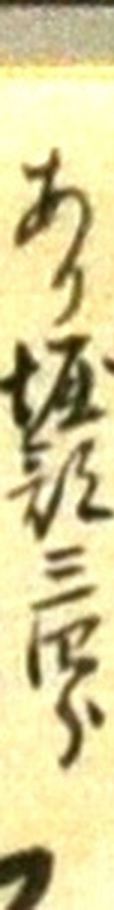あり堀部三四郎
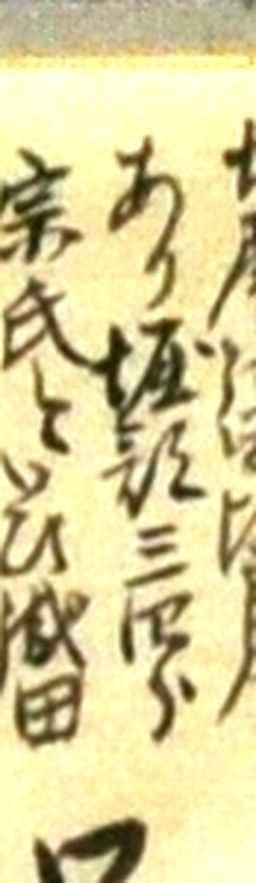宗氏といひ織田
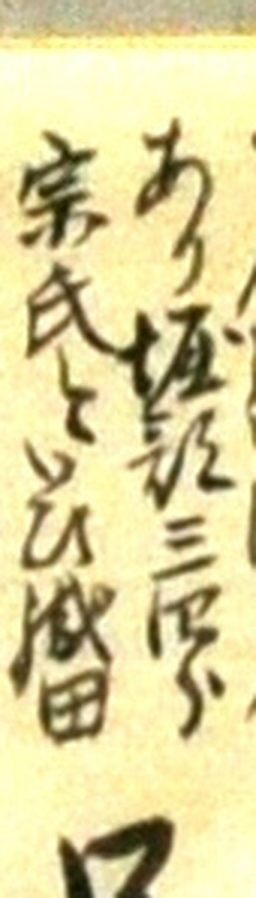宗氏といひ織田
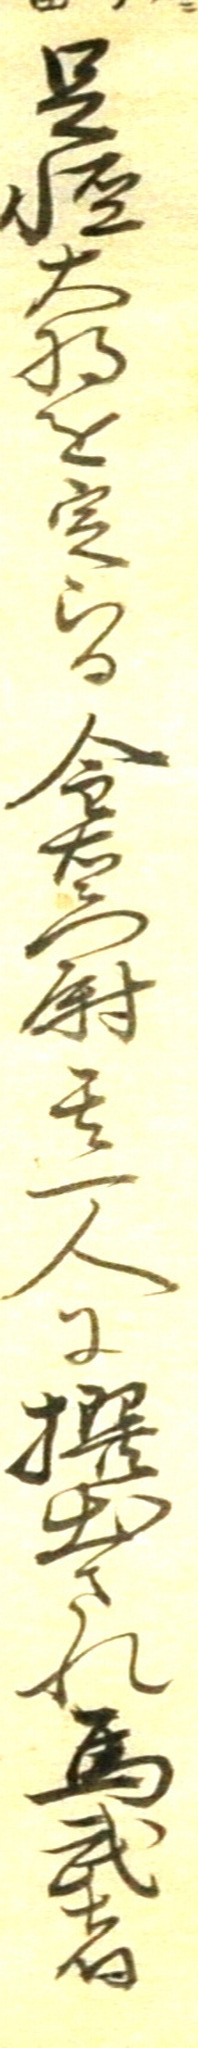足軽大将を定らる金右ヱ門其一人に撰出され馬武者
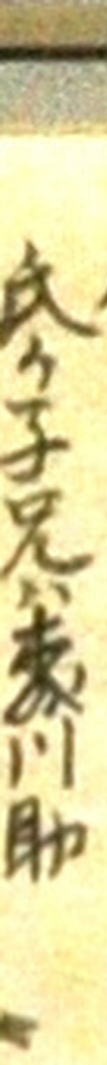氏か子兄は森川助
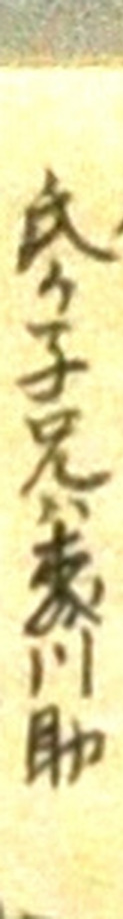氏か子兄は森川助
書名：藩翰譜（五）
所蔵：伊那市立高遠町図書館・合同会社AMANE
